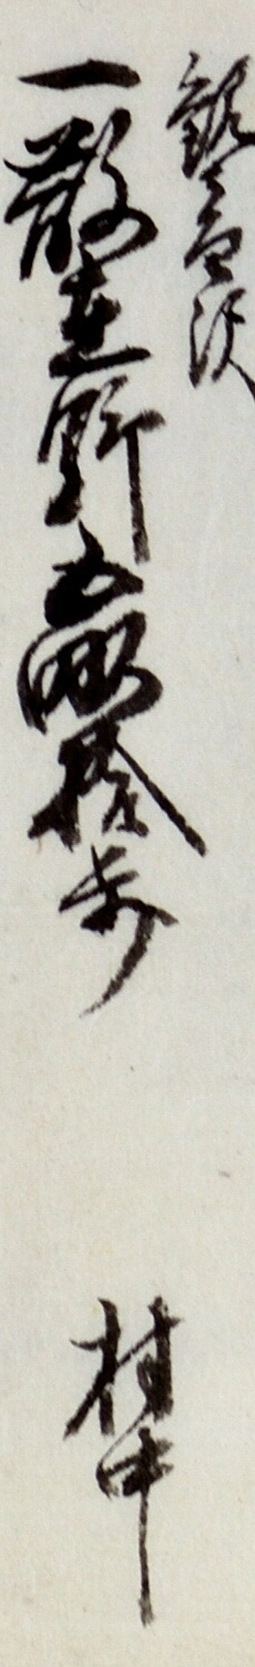一散在野五畝拾歩村中
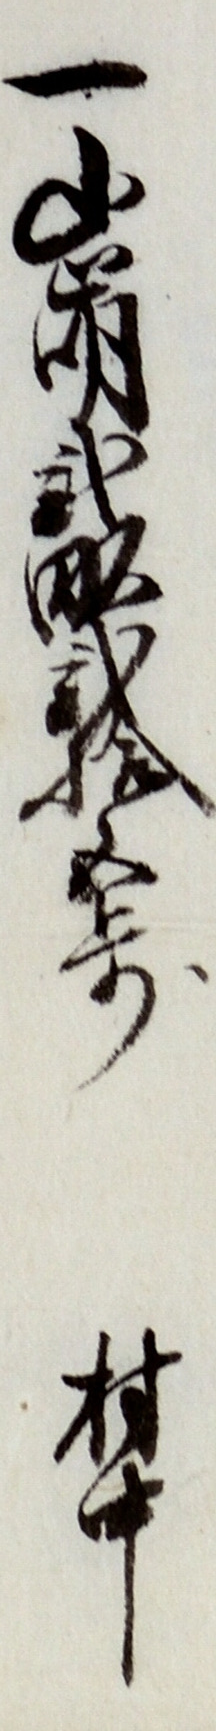一山崩弐畝弐拾五歩村中
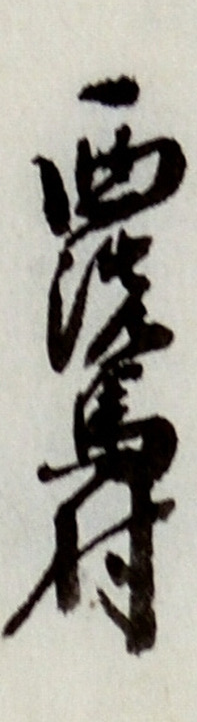西洗馬村
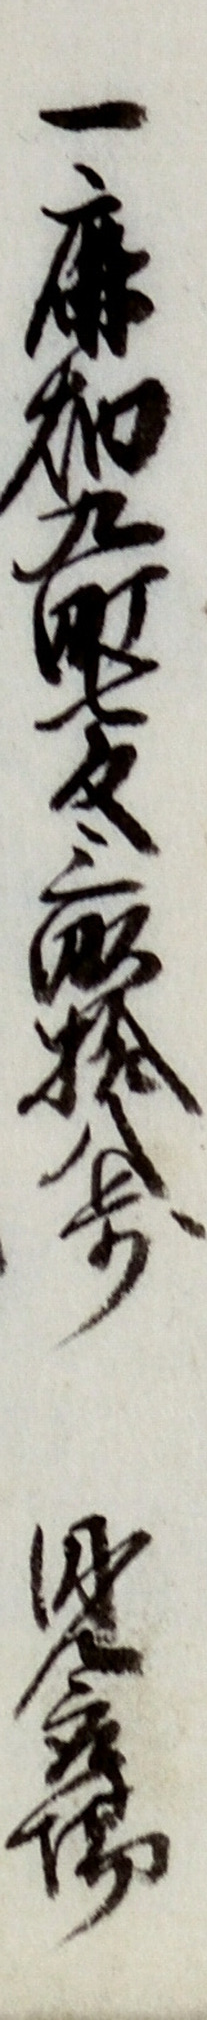一麻畑九町七反三畝拾八歩見取場
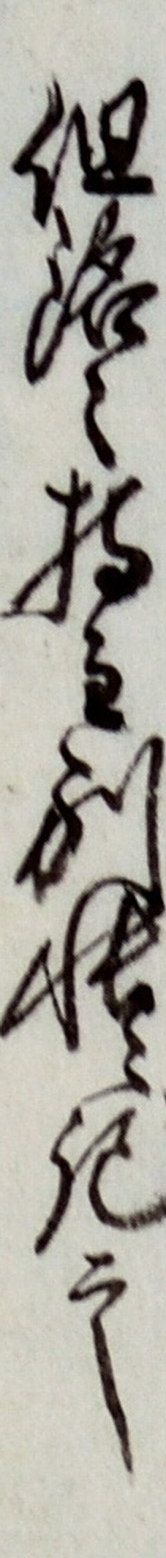但銘々持主別帳ニ記之

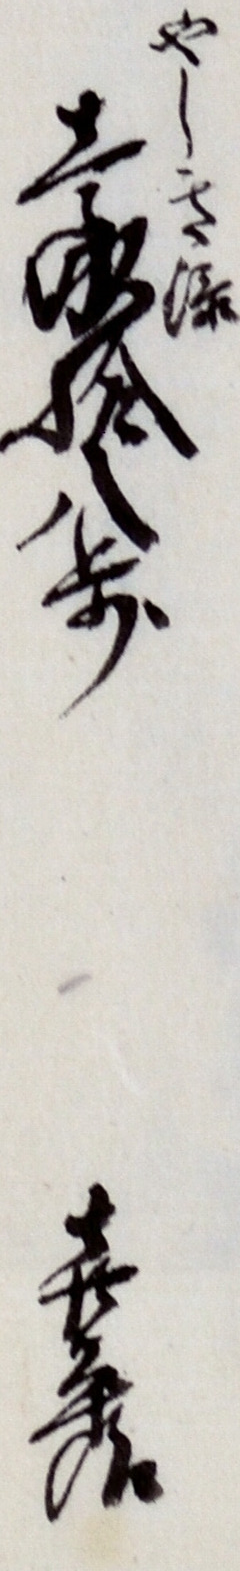壱畝拾弐歩七兵衛
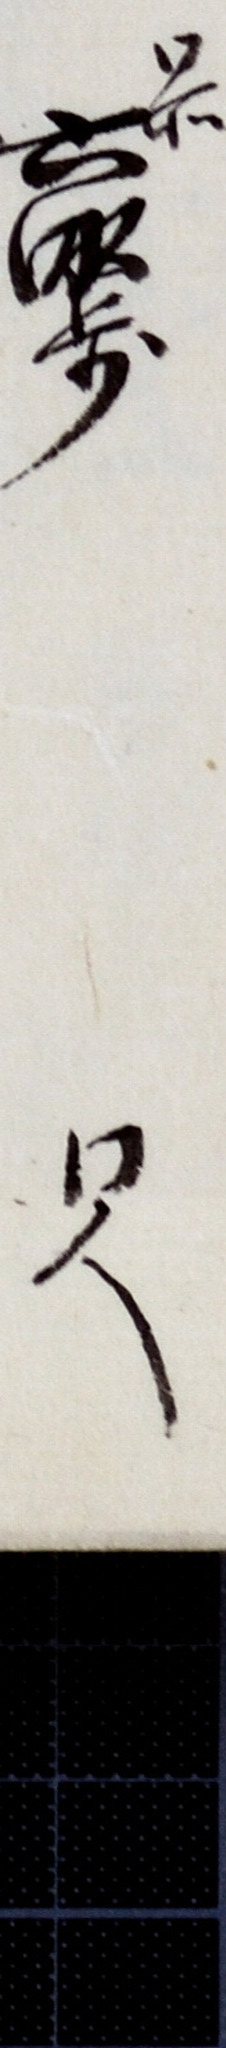六畝歩同人
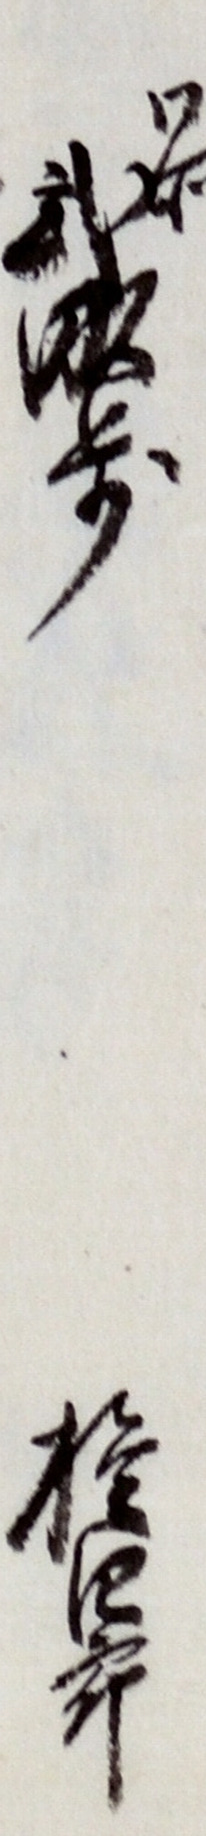弐畝歩権四郎
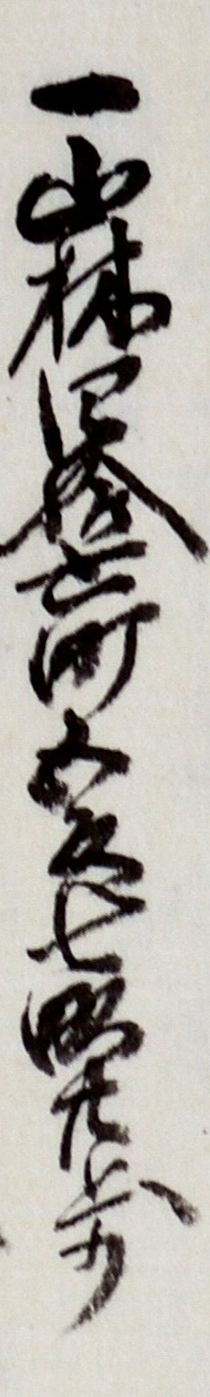一山林四拾六町五反七畝廿歩
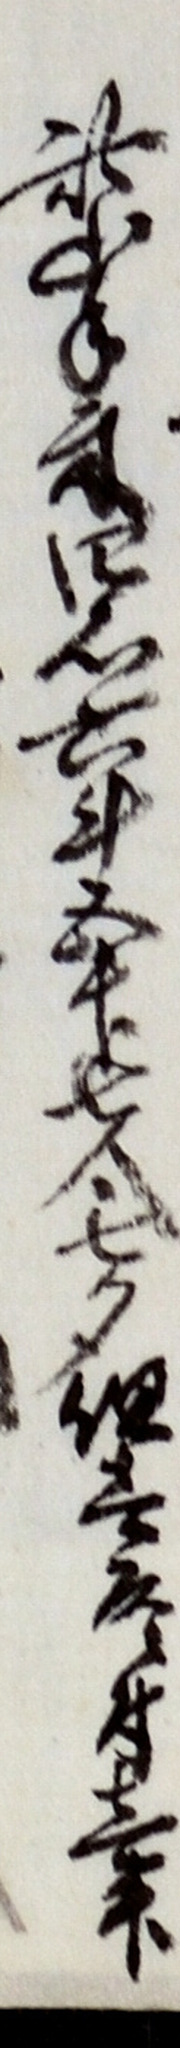此山手米四石六斗五升七合七勺但壱反ニ付一升
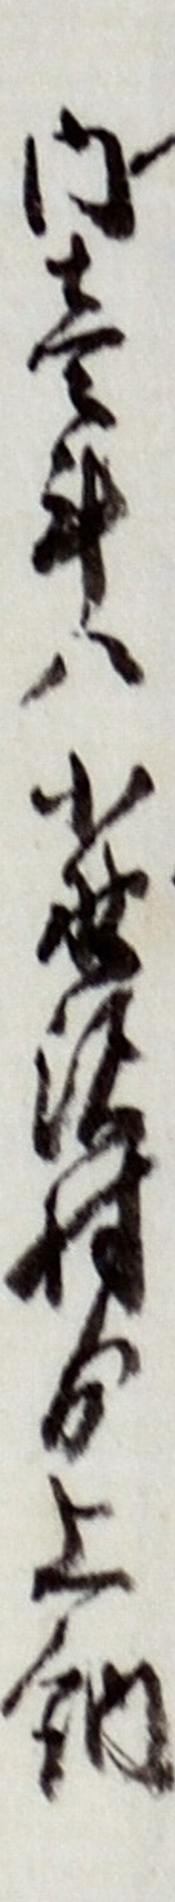内壱斗ハ小野沢村より上納
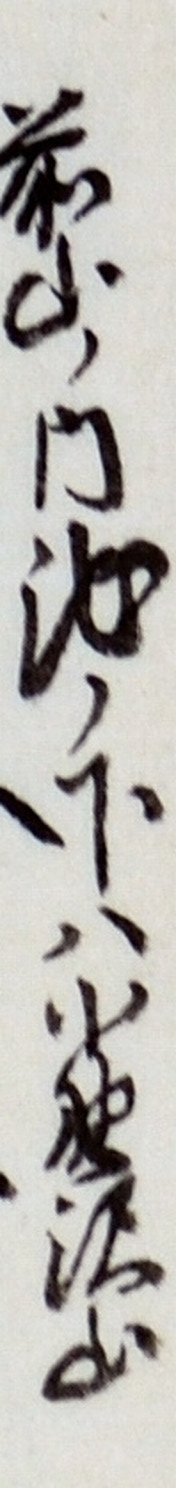前山ノ内池ノ下ハ小野沢山
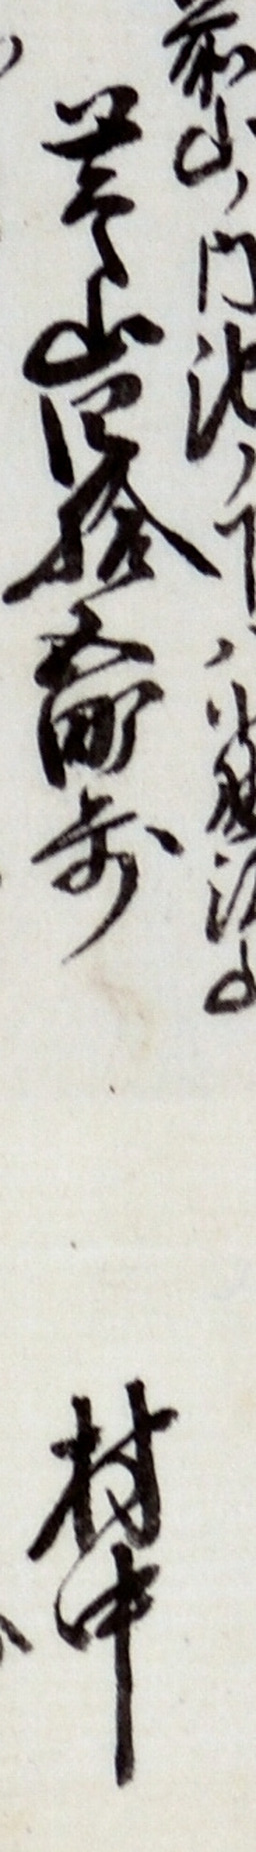芝山四拾五町歩村中
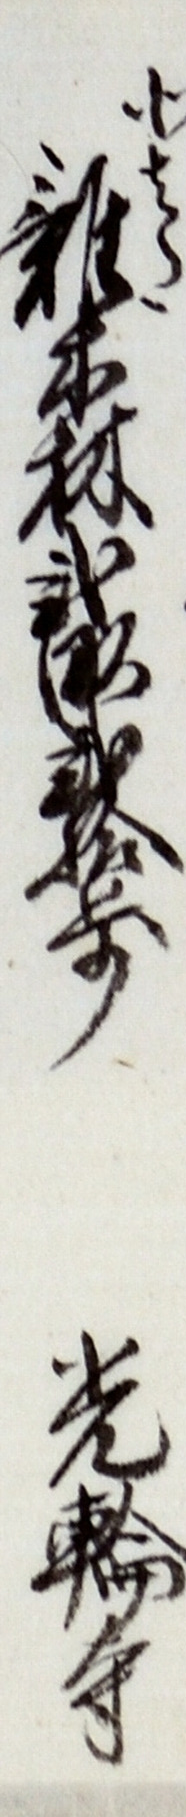雑木林弐畝弐拾歩光輪寺

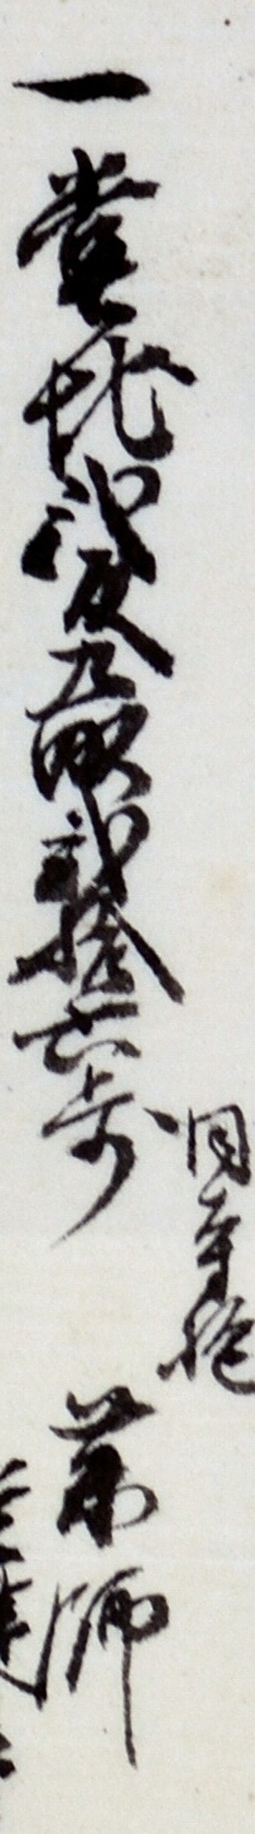一堂地弐反九畝弐拾六歩薬師
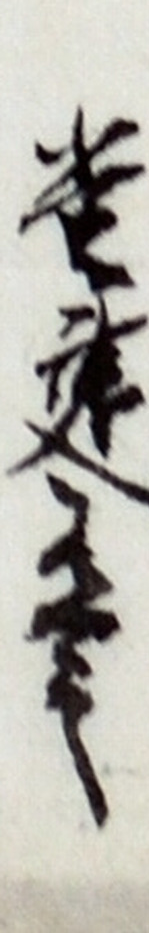堂建有之
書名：御領分中山林社地手控
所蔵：伊那市立高遠町図書館・合同会社AMANE
